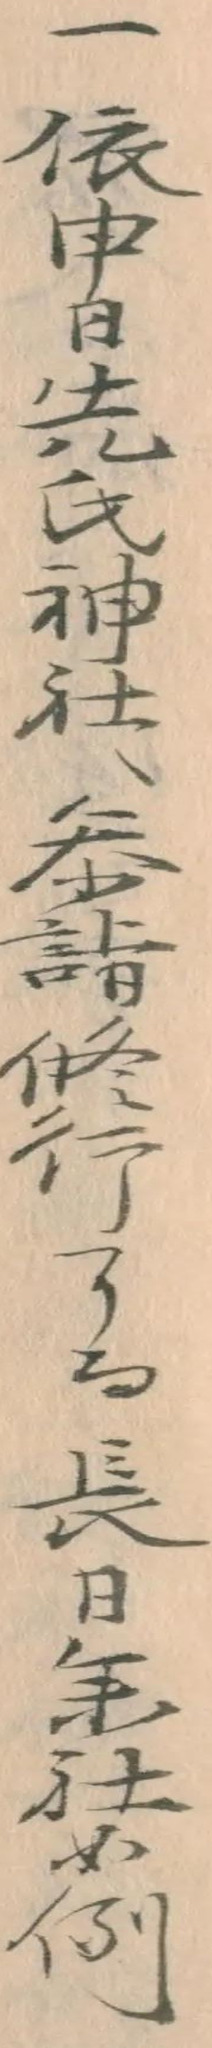一依申日先氏神社へ参詣修行了而長日参社如例
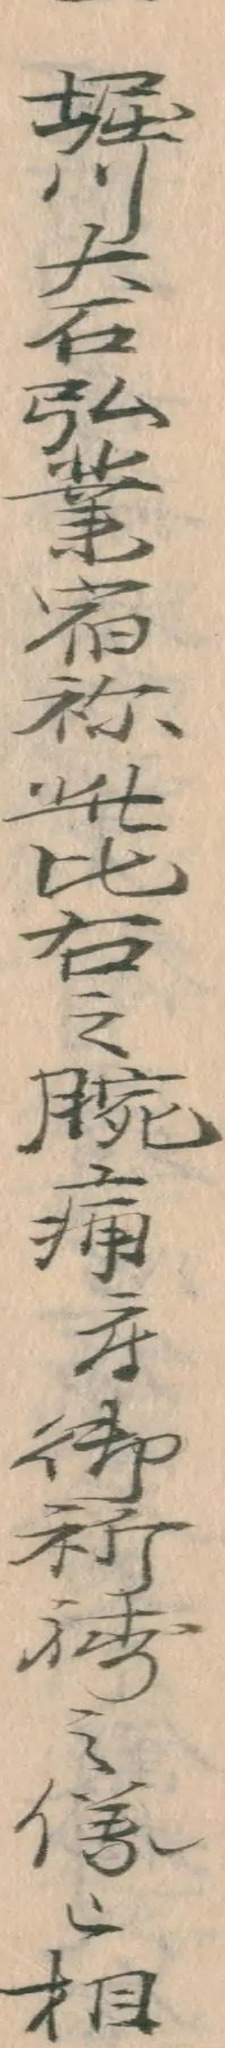一堀川大石弘業宿祢此比右之腕痛ニ付御祈祷之儀被相
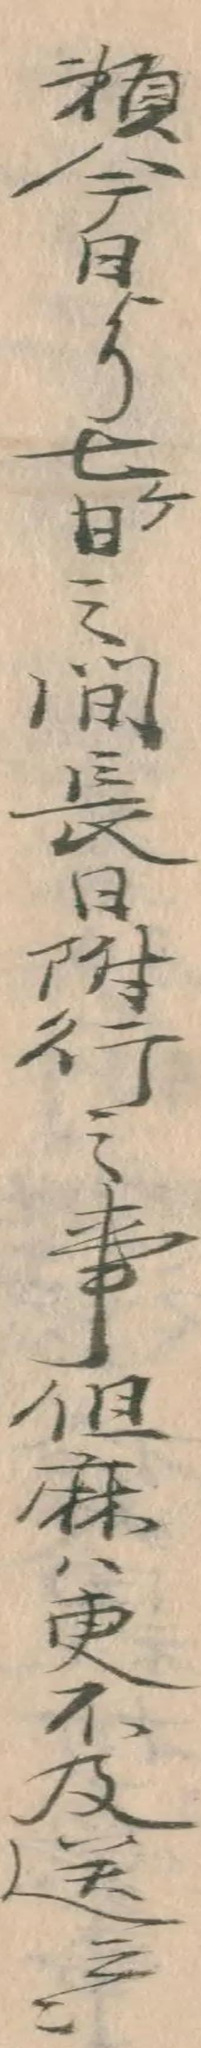頼今日より七ヶ日之間長日附行之事但麻ハ更不及送云々
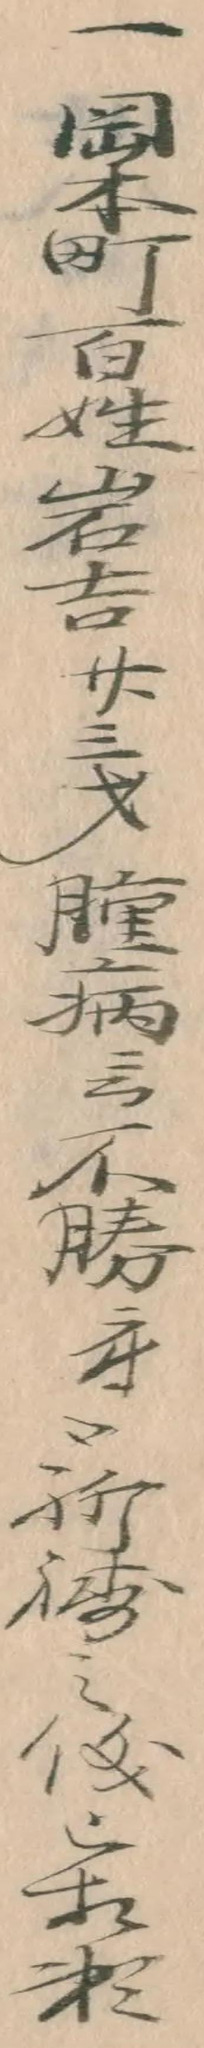一岡本町百姓岩吉廿三才腫病ニ而不勝ニ付御祈祷之儀被相頼
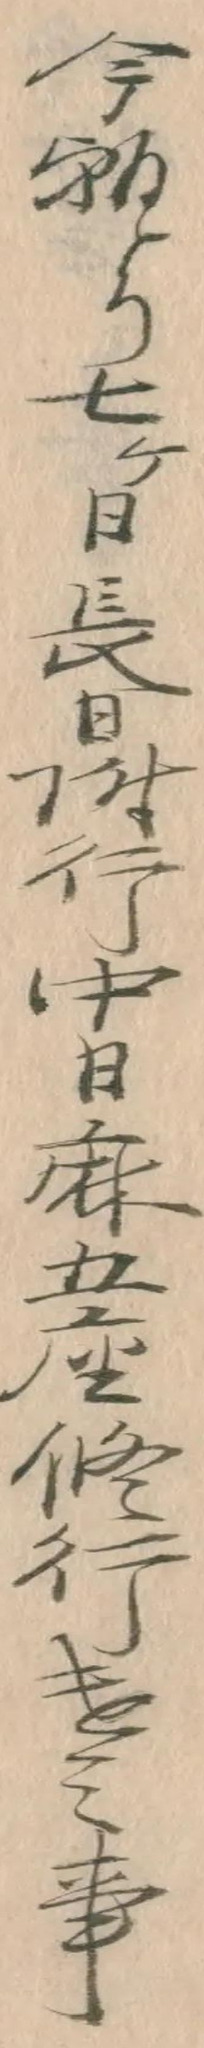今朝より七ヶ日長日附行中日麻五座修行遣之事
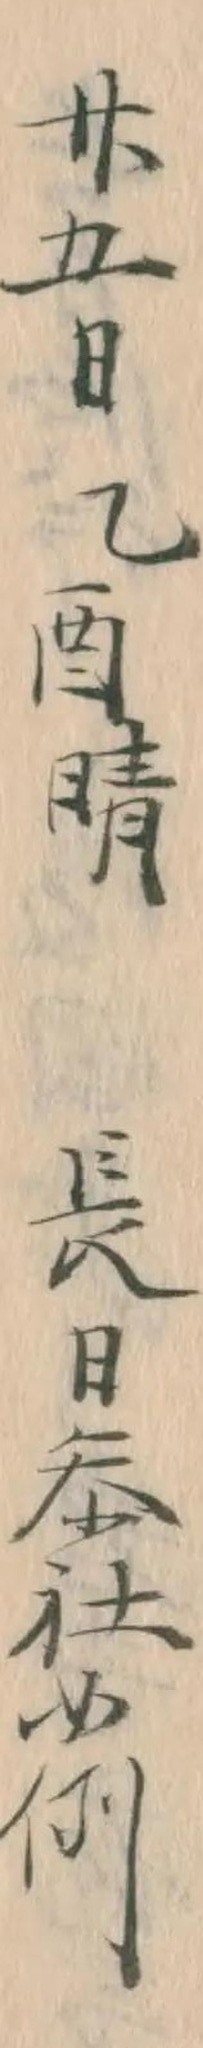廿五日乙酉晴長日参社如例
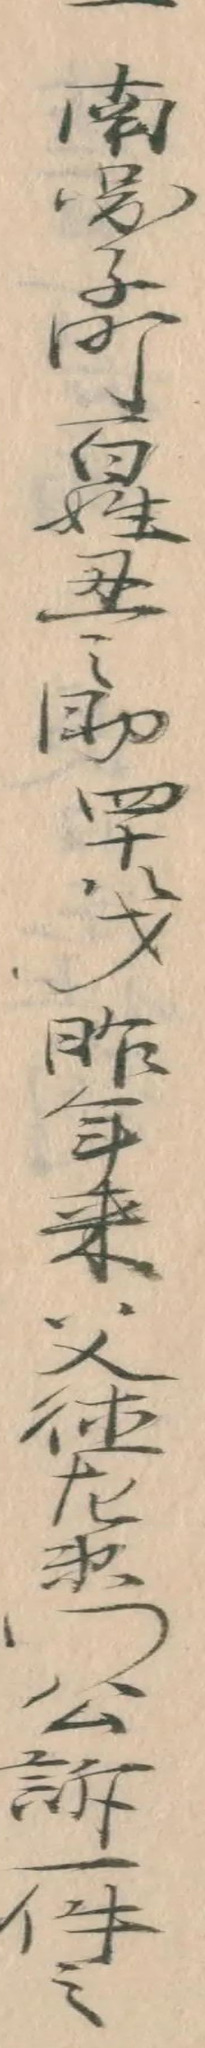一南図子町百姓丑之助四十八才昨年来父徳左衛門公訴一件之
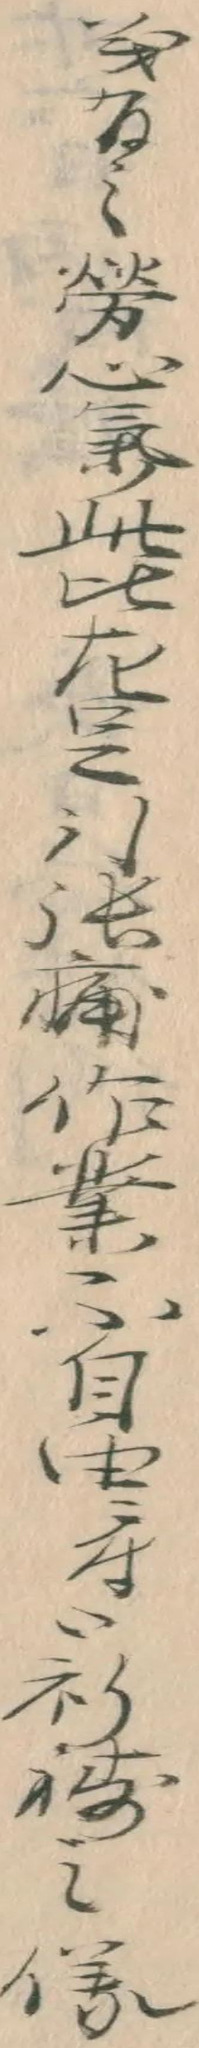義有之労心氣此比左足引張痛作業不自由ニ付御祈祷之儀
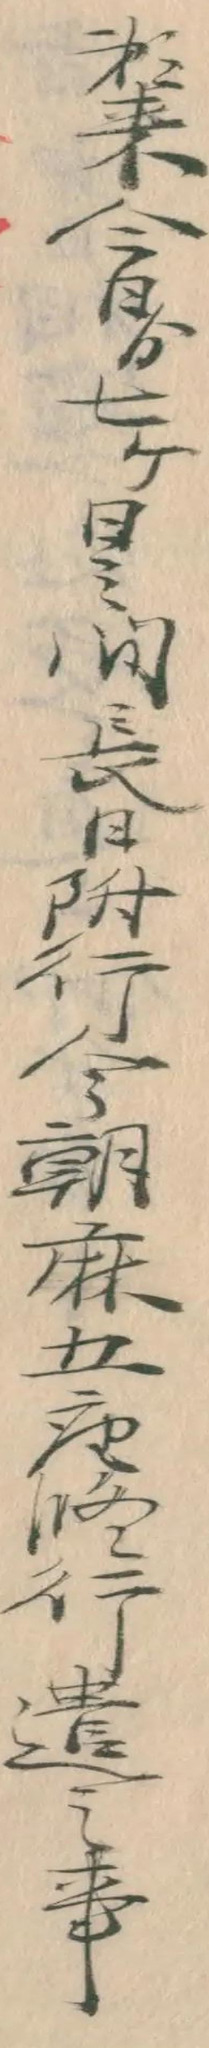頼来今日ゟ七ヶ日之間長日附行今朝麻五座修行遣之事

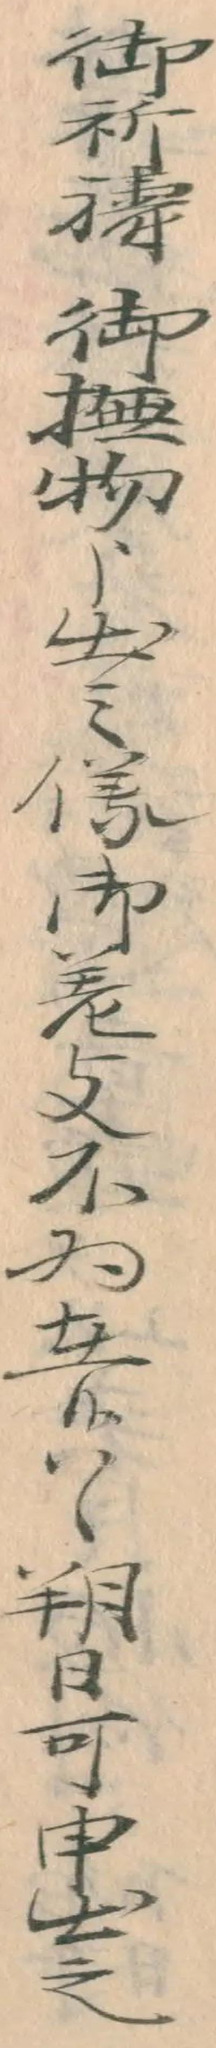御祈祷御撫物申出之儀御差支不為在候ハヽ朔日可申出之
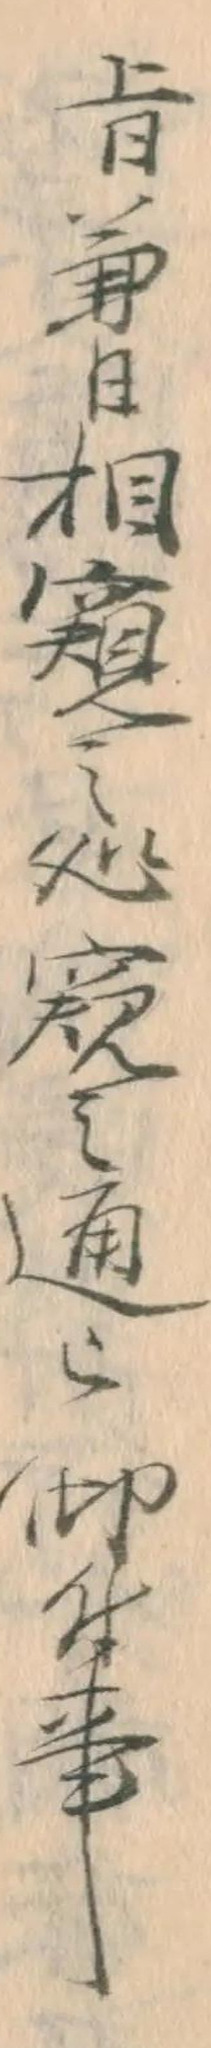旨兼日相窺之処窺之通被仰付事
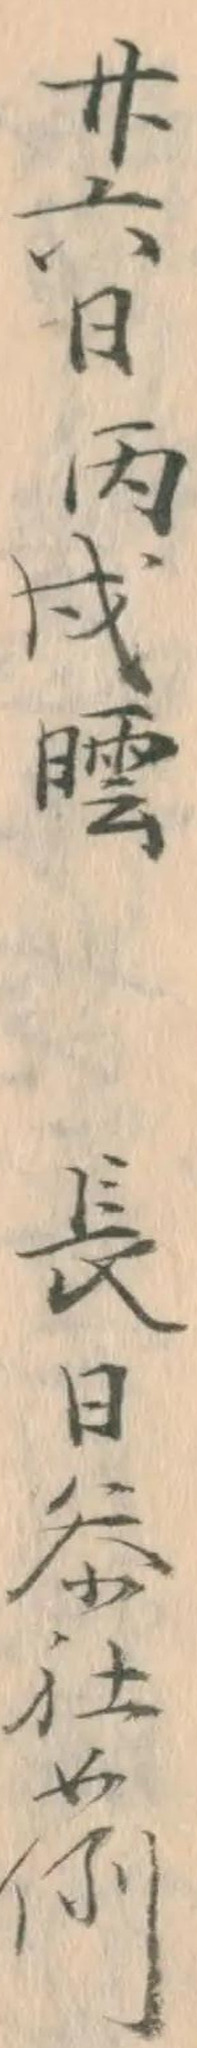廿六日丙戌曇長日参社如例
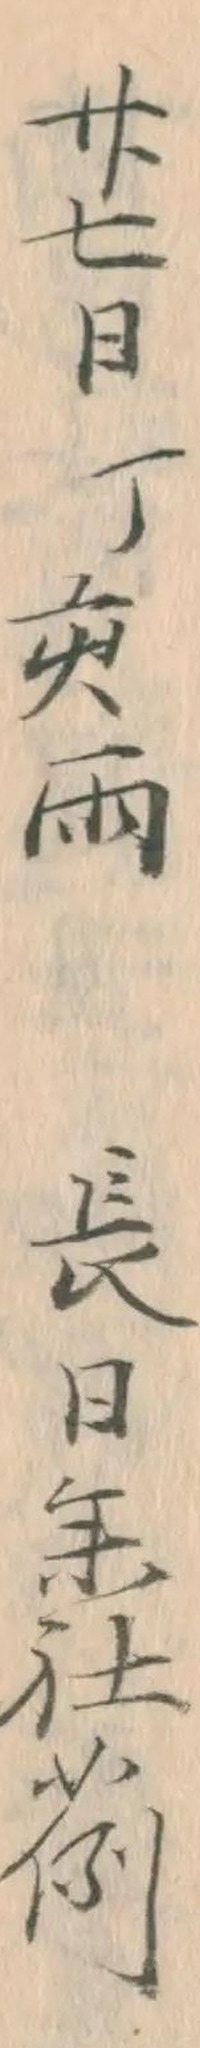廿七日丁亥雨長日参社如例
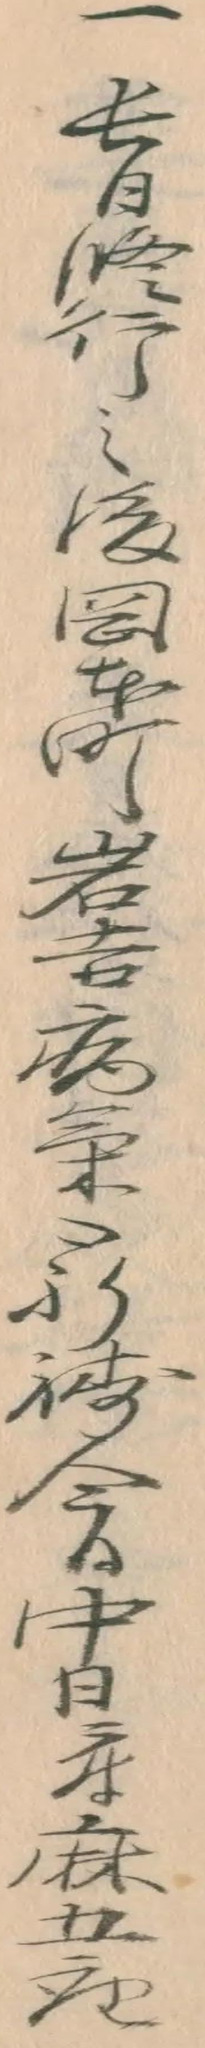一長月修行之後岡本町岩吉病氣御祈祷今日中日ニ付麻五座
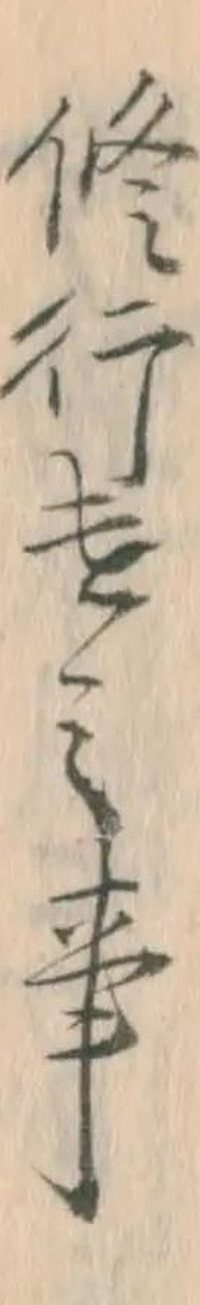修行遣之事
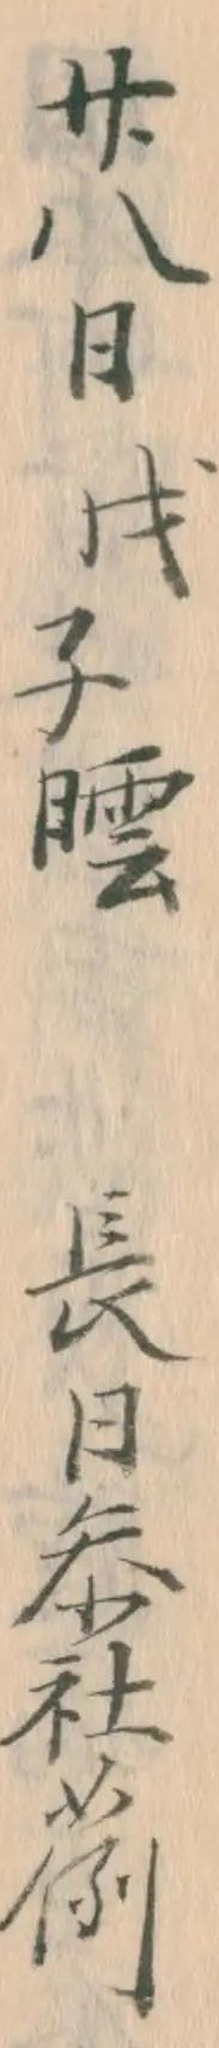廿八日戊子曇長日参社如例
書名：賀茂社記録. 第73冊
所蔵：国立国会図書館 National Diet Library, JAPAN
